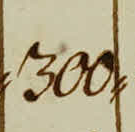300
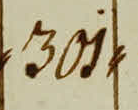301
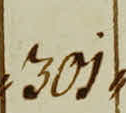301
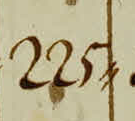225
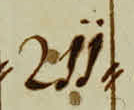211
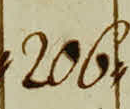206
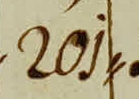201
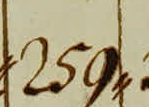259
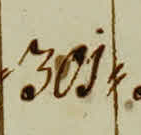301
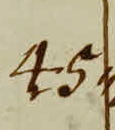45
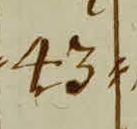43
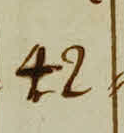42
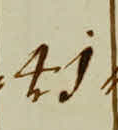41
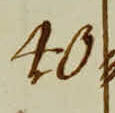40
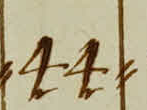44
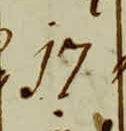17
